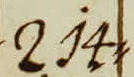214
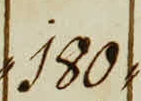180
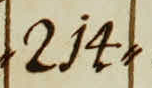214
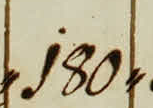180
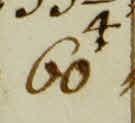60
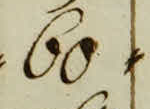60
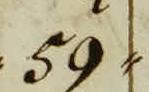59
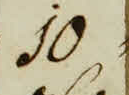10
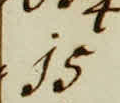15
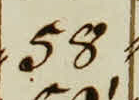58
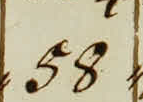58
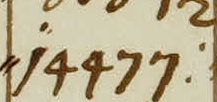14477
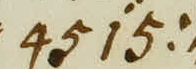4515
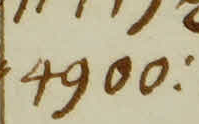4900
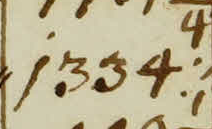1334
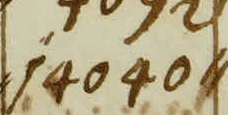14040
